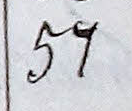57
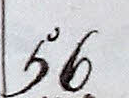56
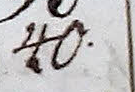40.
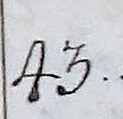43
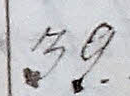39
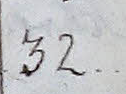32
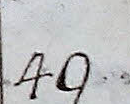49
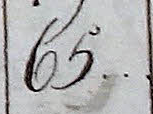65.
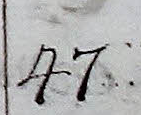47.
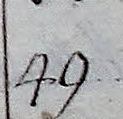49
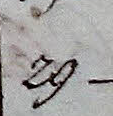29
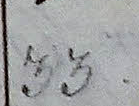33
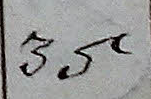35
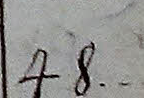48.
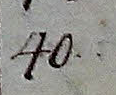40.
